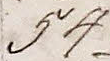54
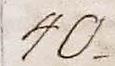40
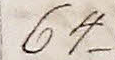64
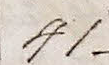41
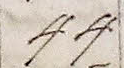44
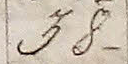38
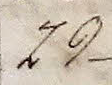29
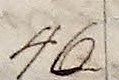46
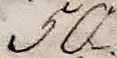50
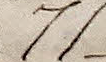71
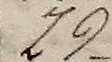29
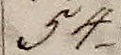54
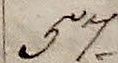57
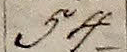54
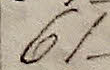61
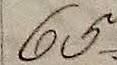65
